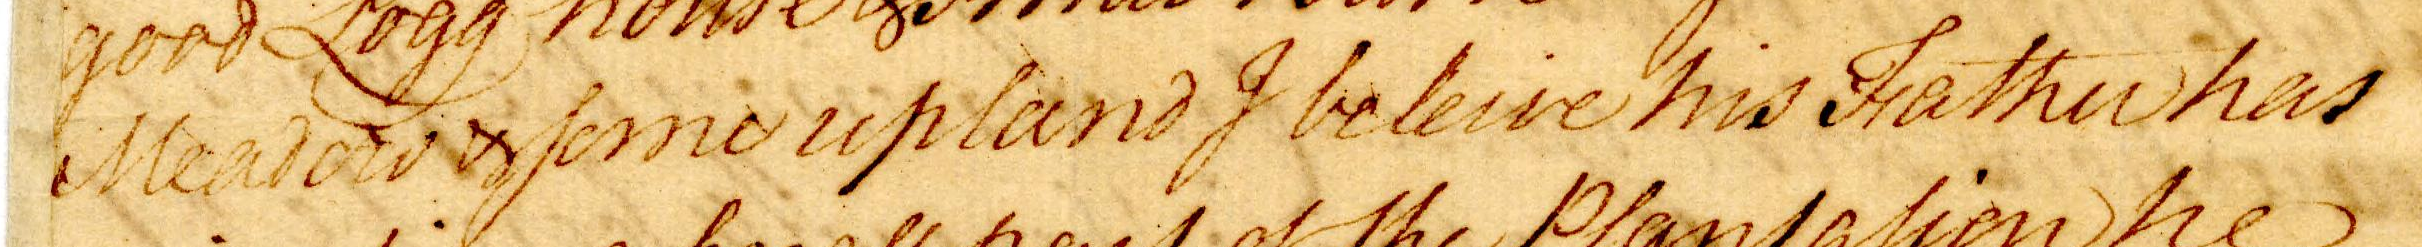Meadow & some upland I believe his Father has
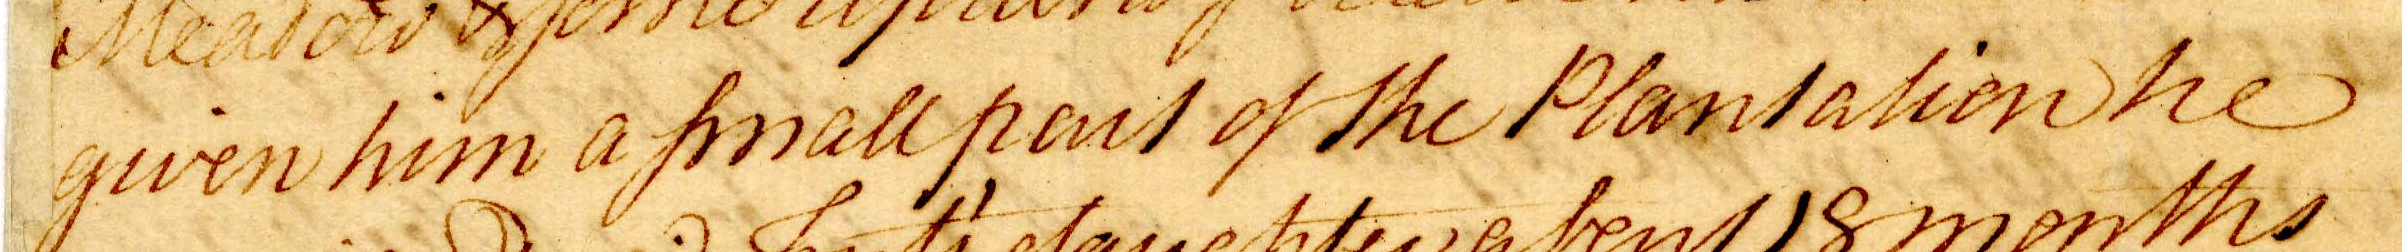given him a small part of the Plantation he
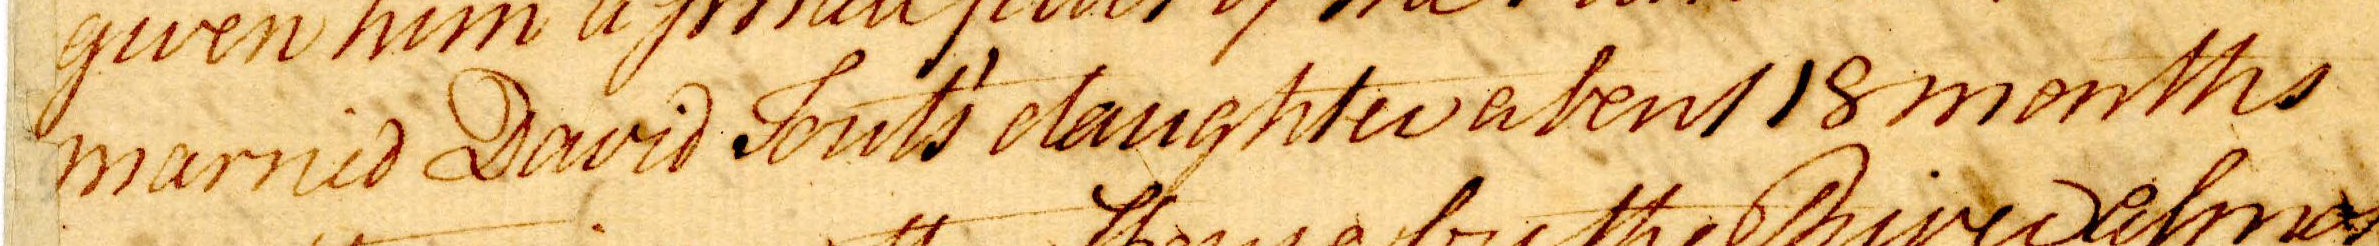married David Foul's daughter about 18 months
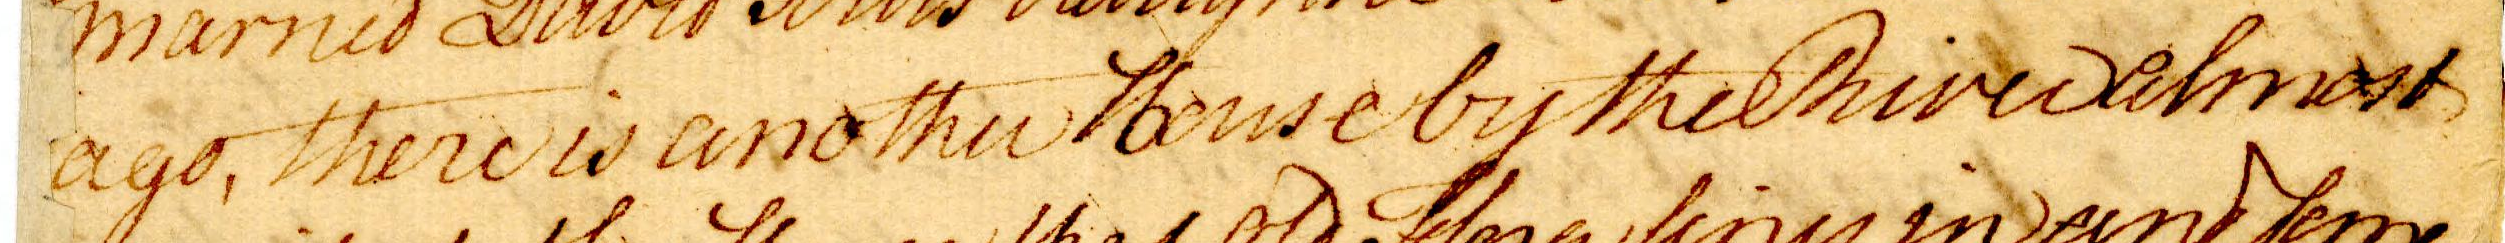ago, there is another House by the River almost
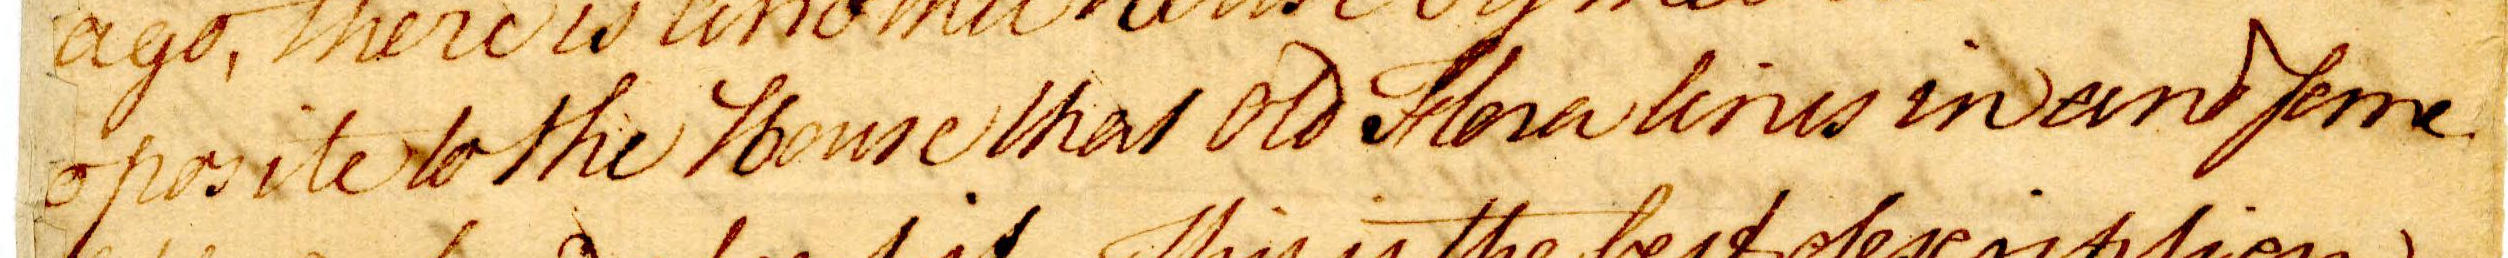oposite to the House that old Flora lives in and some
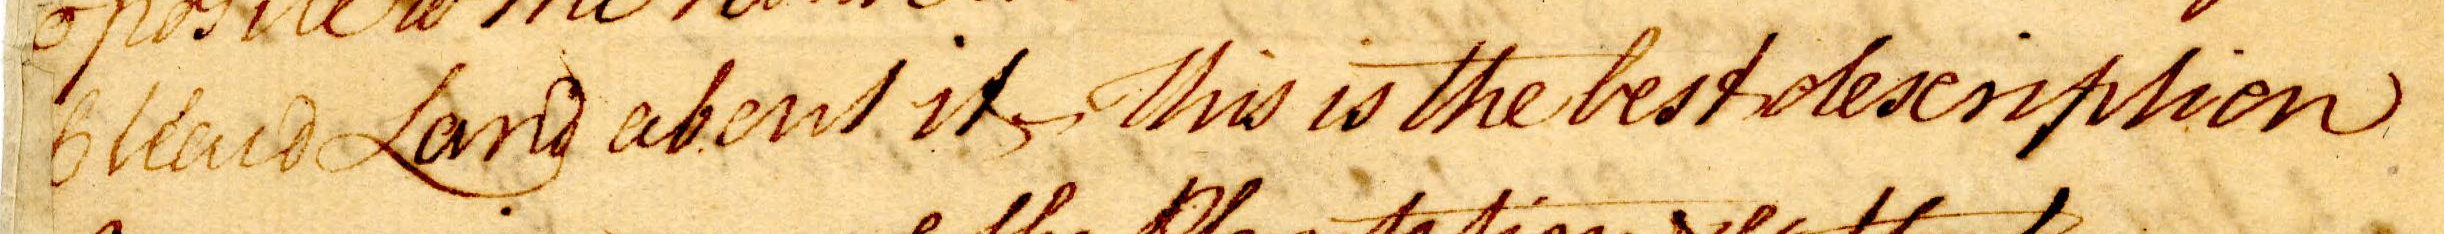Cleared Land about it. This is the best description
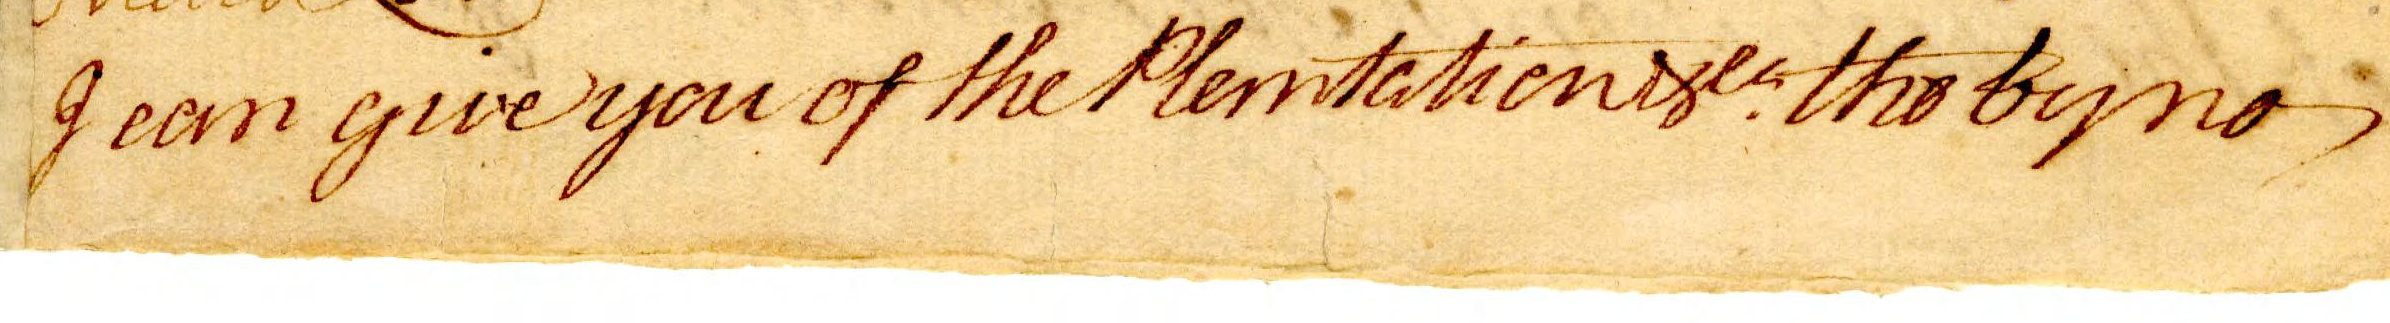I can give you of the Plantations &c. tho by no
